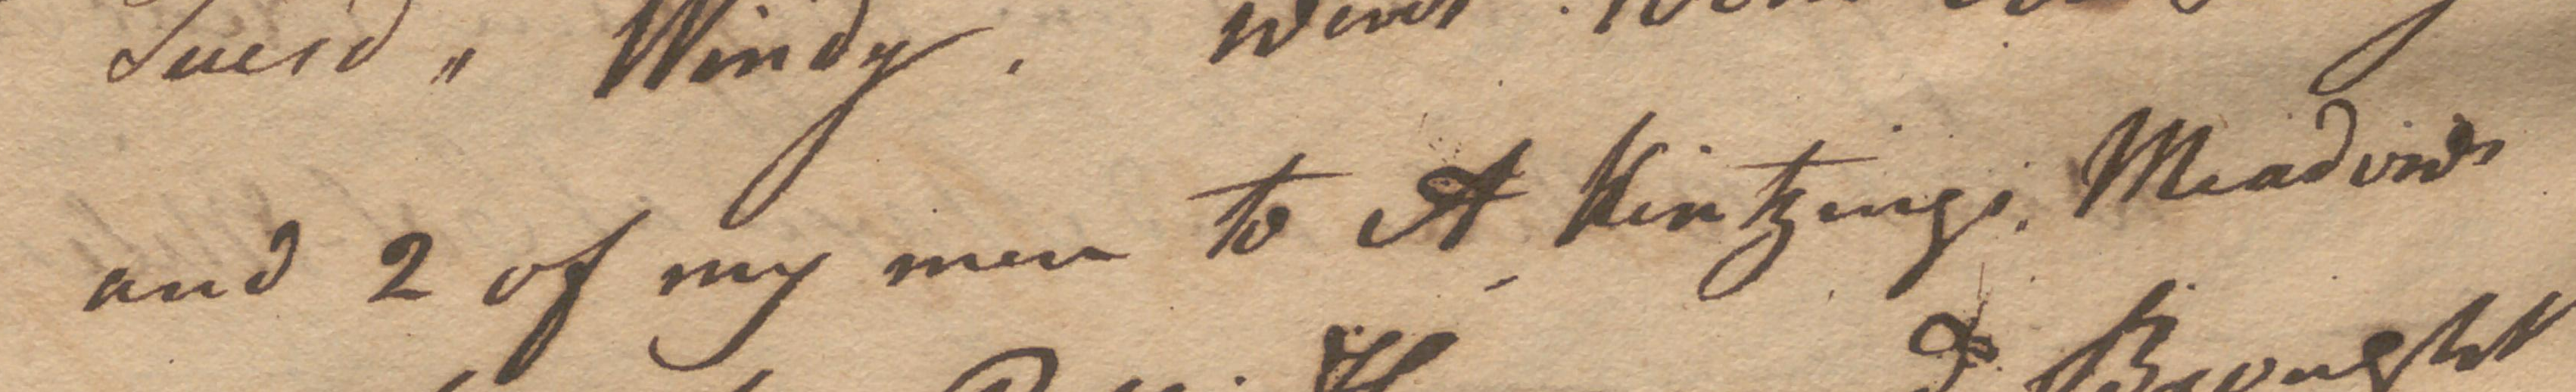and 2 of my men to A Kintzings Meadows
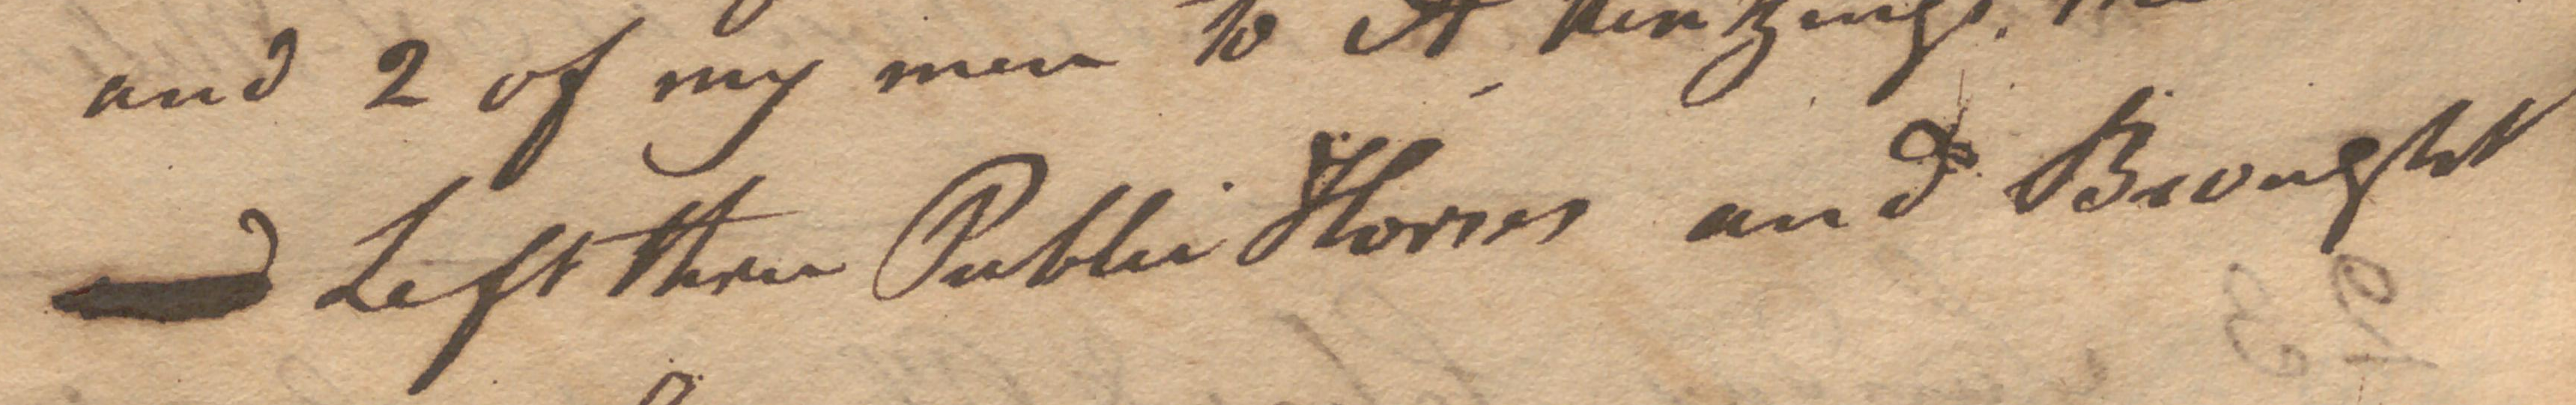[___] Left them Public Hores and Brought
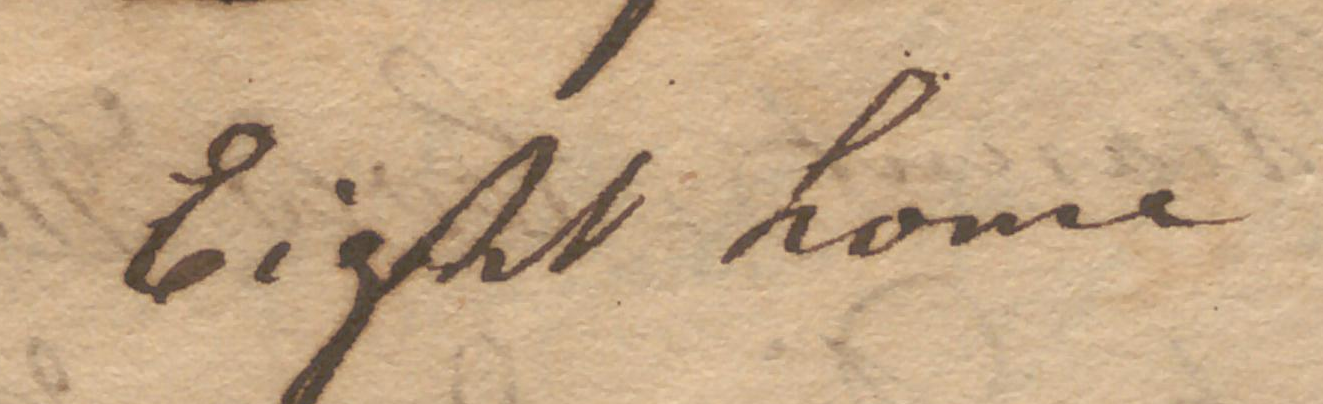Eight home
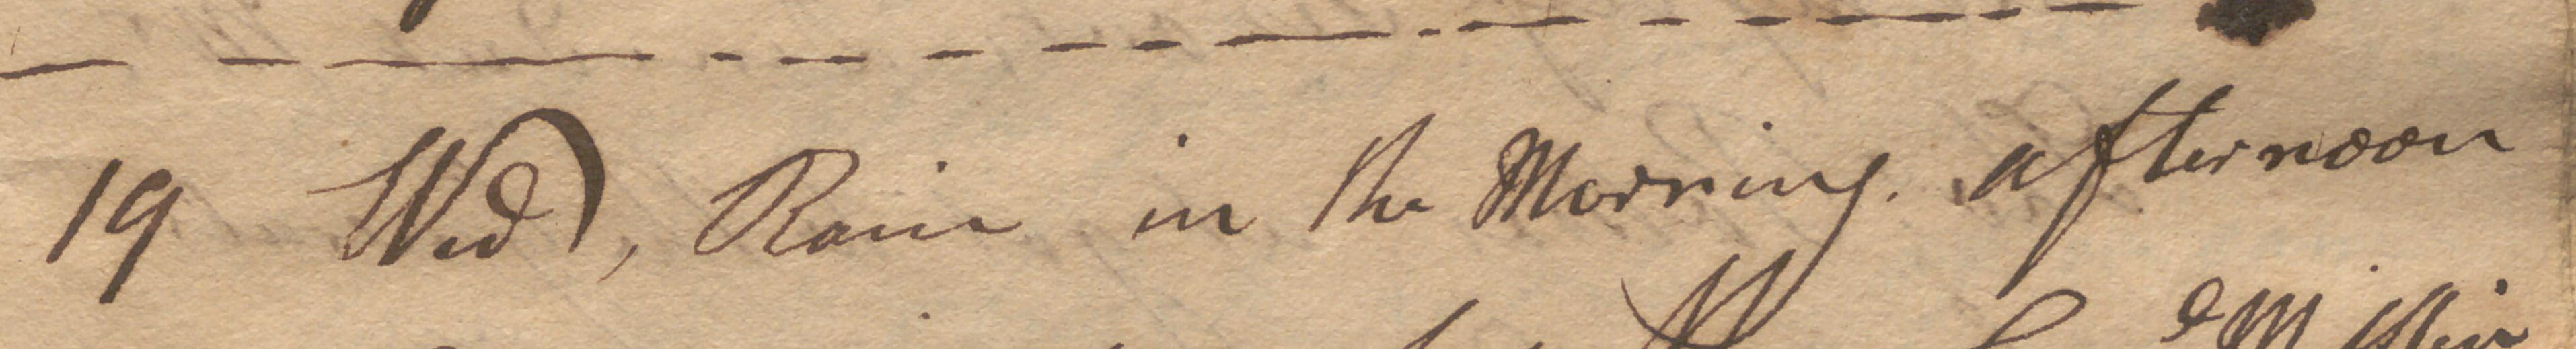19 Wedd, Rain in the Morning afternoon
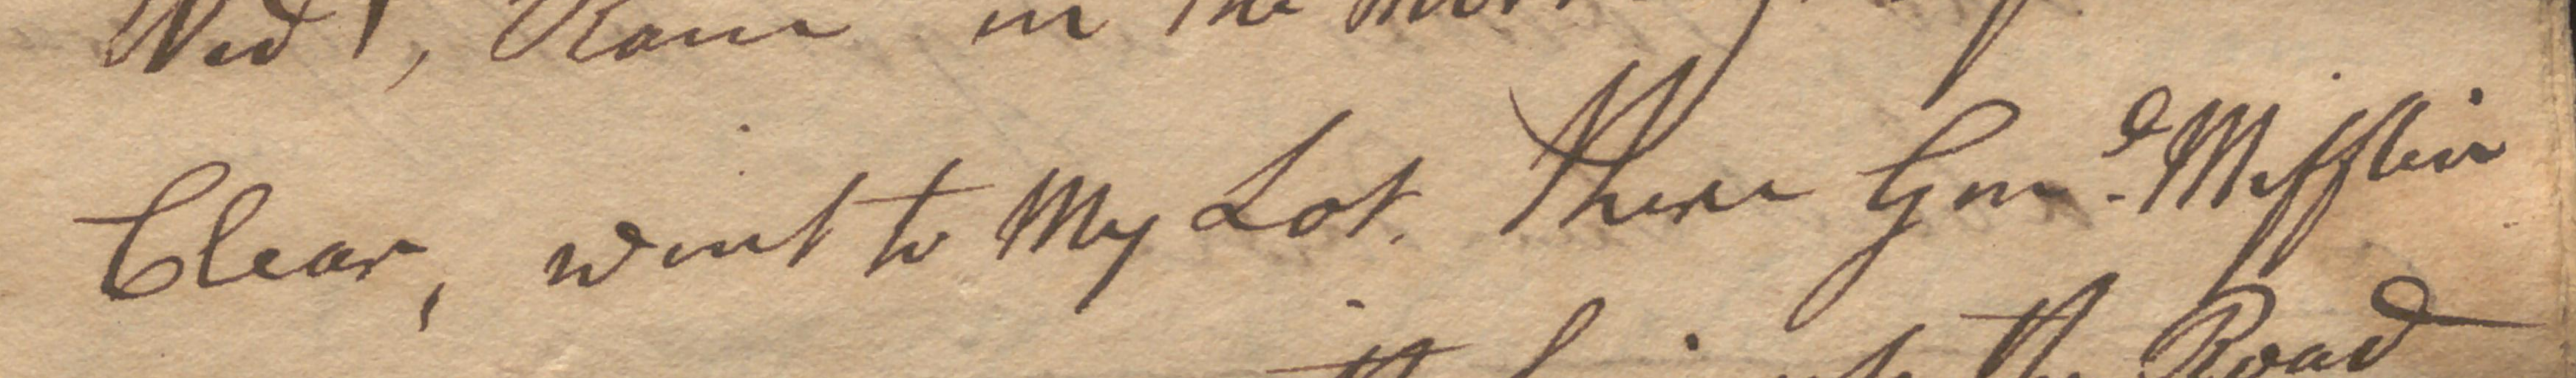Clear, went to My Lot. These Gen^l. Mifflin
